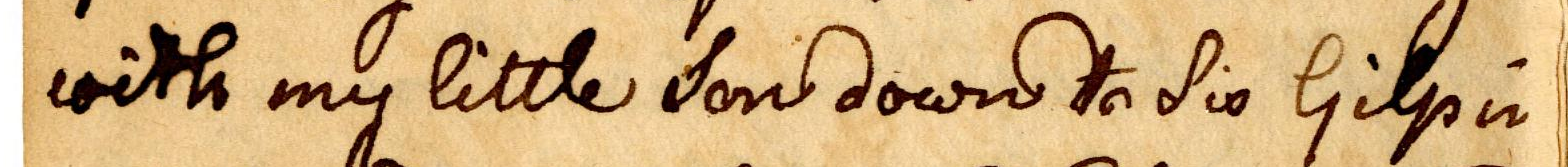with my little Son down to Sis Gilpin
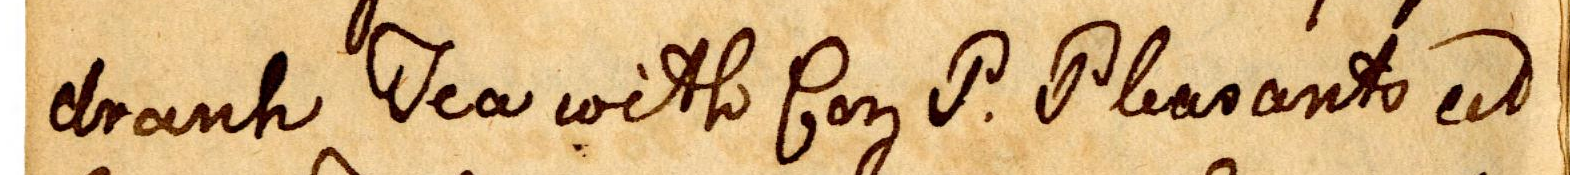drank Tea with Coz P. Pleasants at
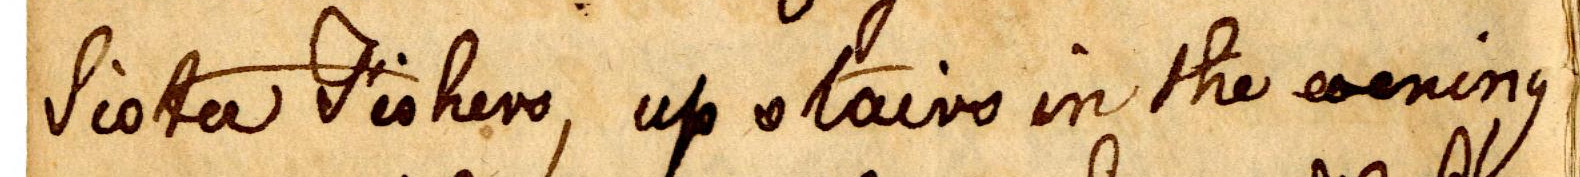Sister Fishers, up stairs in the evening
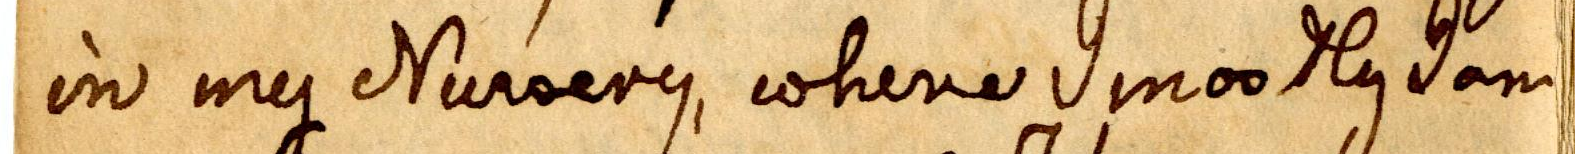in my Nursery, where I mostly I am
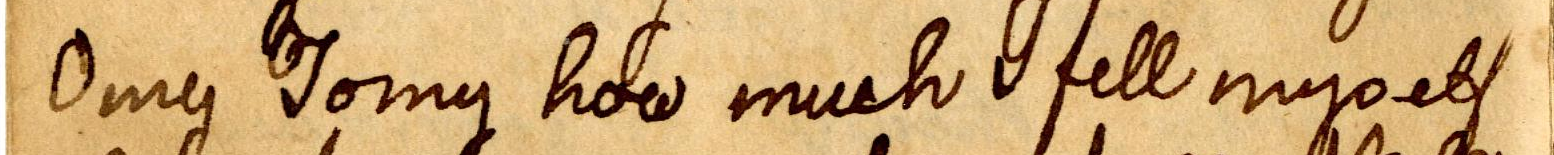O my Tomy how much I fell myself
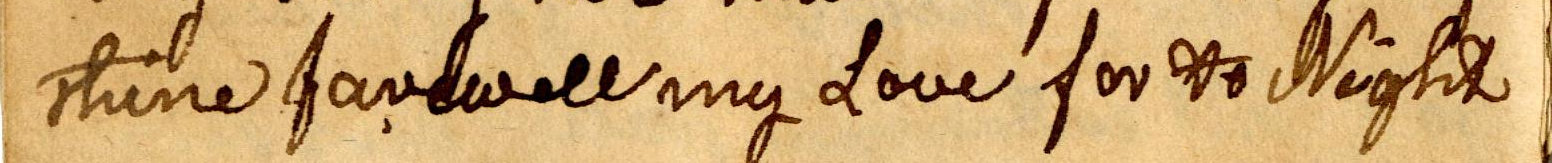thine farewell my Love for to Night
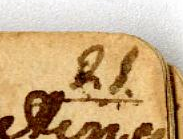21
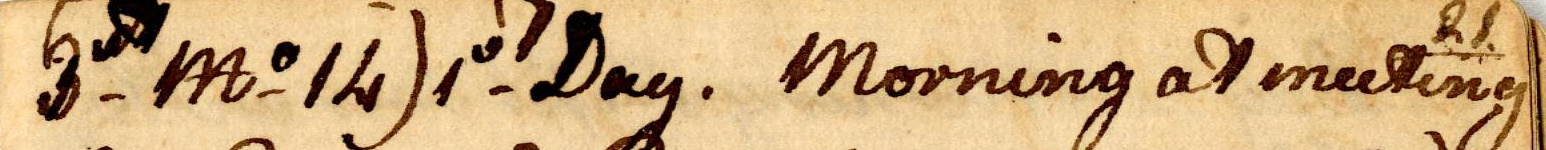5^th M^o 14) 1^st Day. Morning at meeting
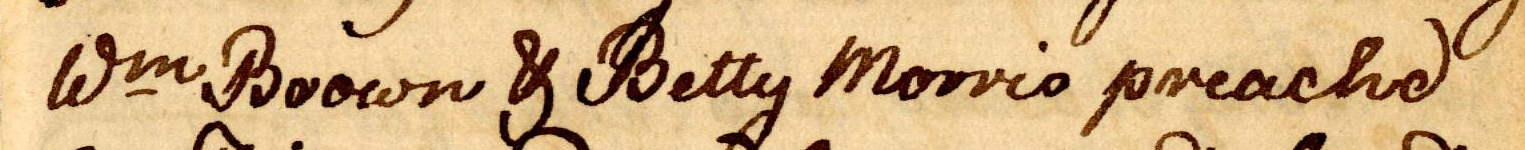W^m Brown & Betty Morris preachd
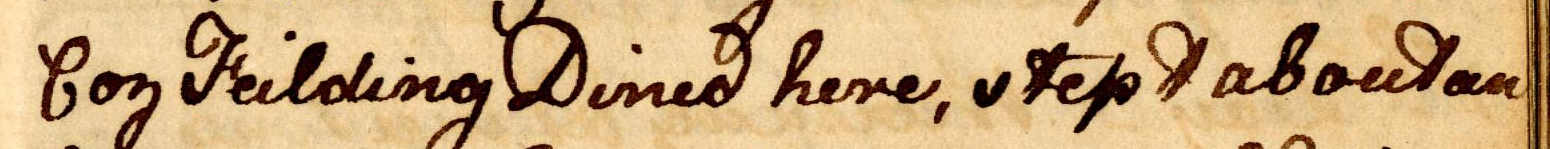Coz Feilding Dined here, stept about an
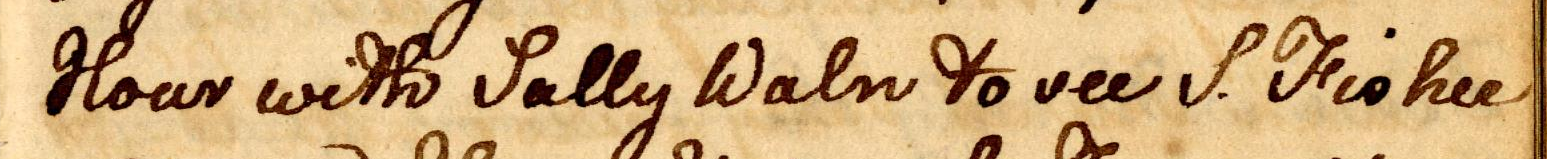Hour with Sally Waln to see S. Fisher
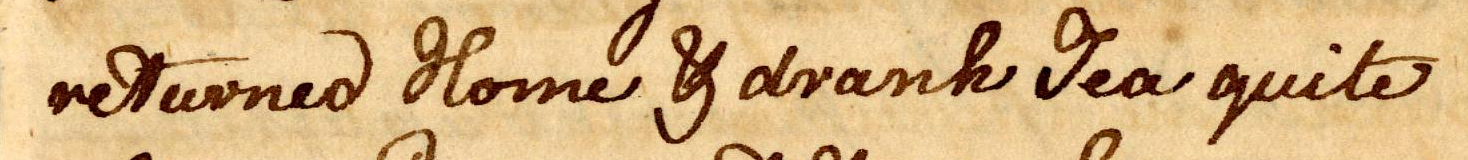returned Home & drank Tea quite
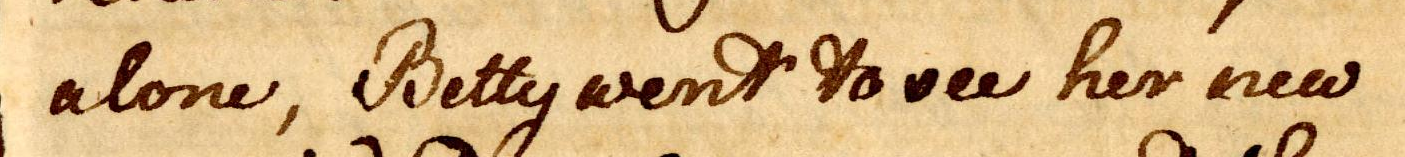alone, Betty went to see her new
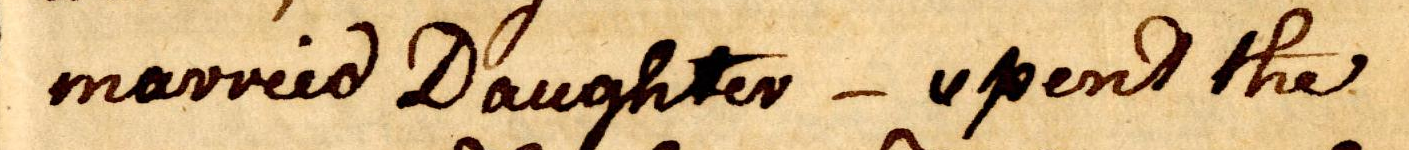married Daughter- spent the
